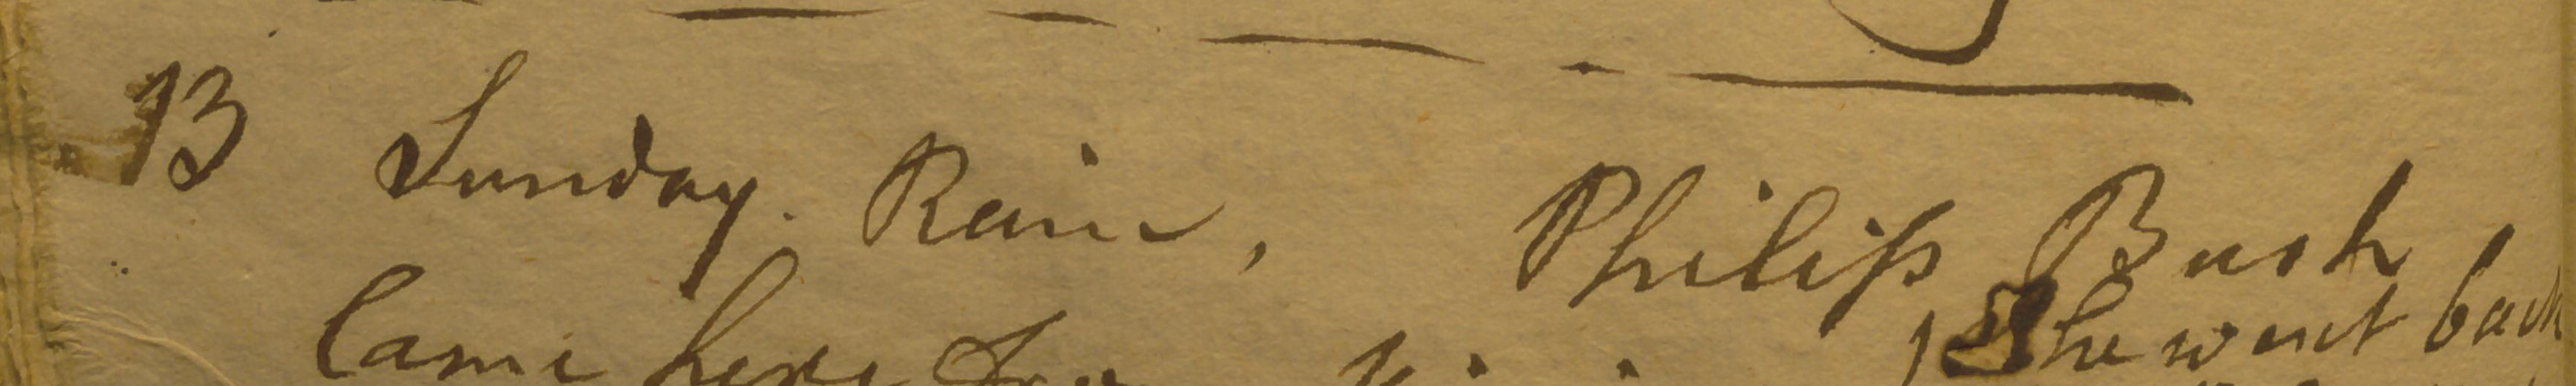13 Sunday. Rain, Philip Bush
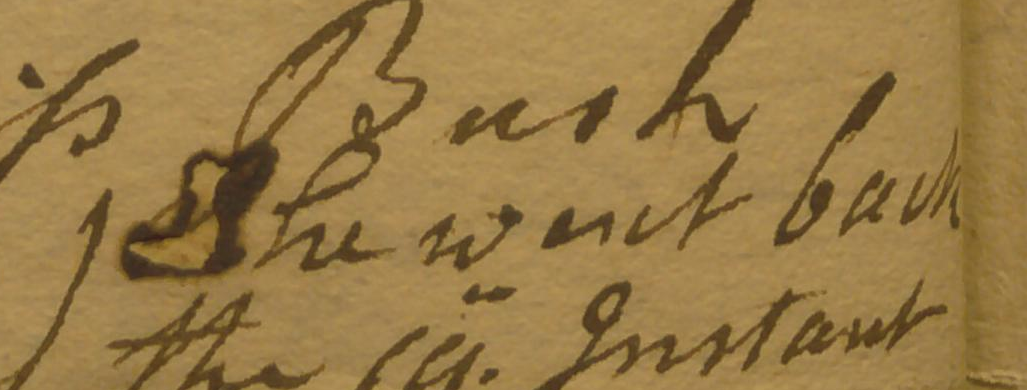he went back
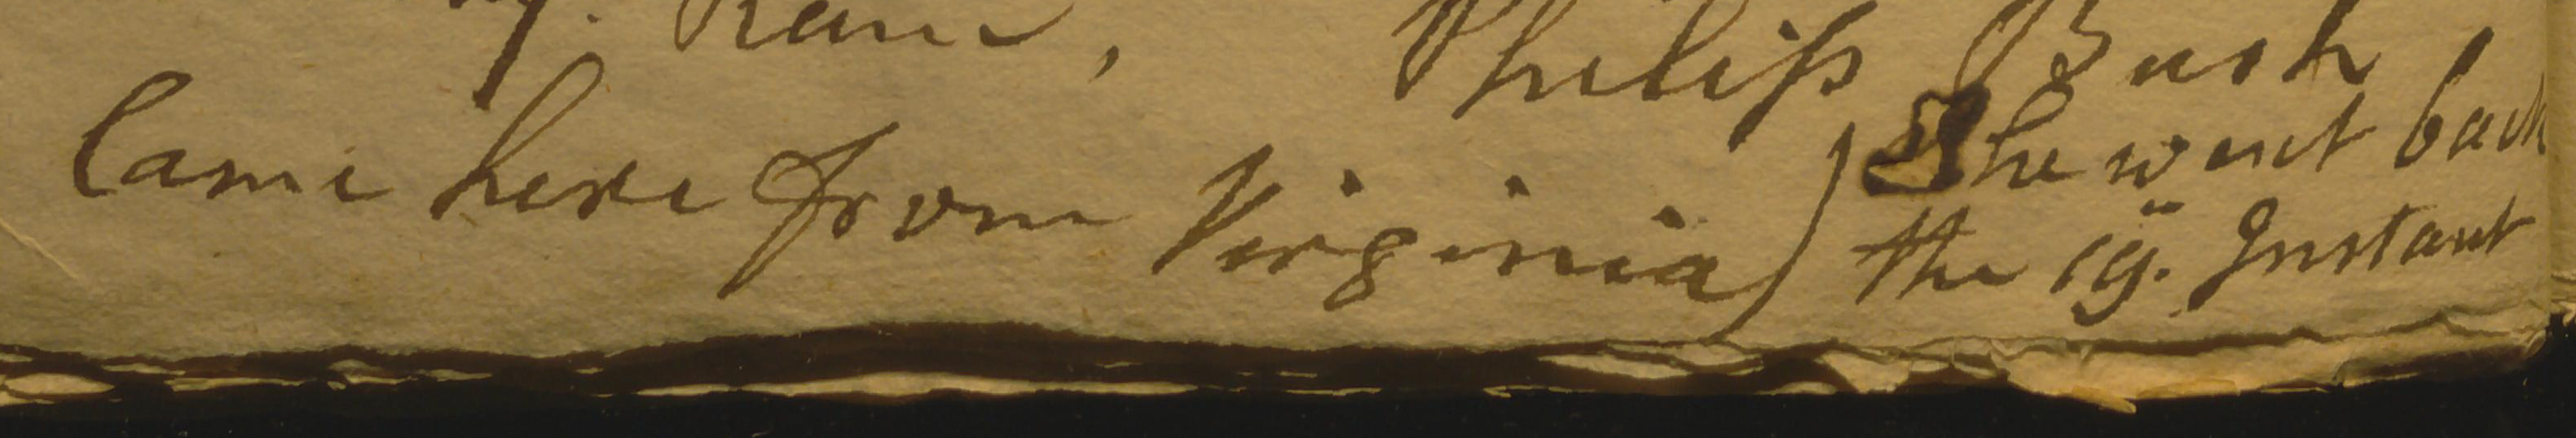lame here from Virginia) the 19^th. Instant
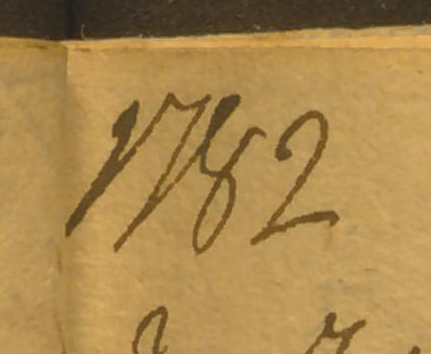1782
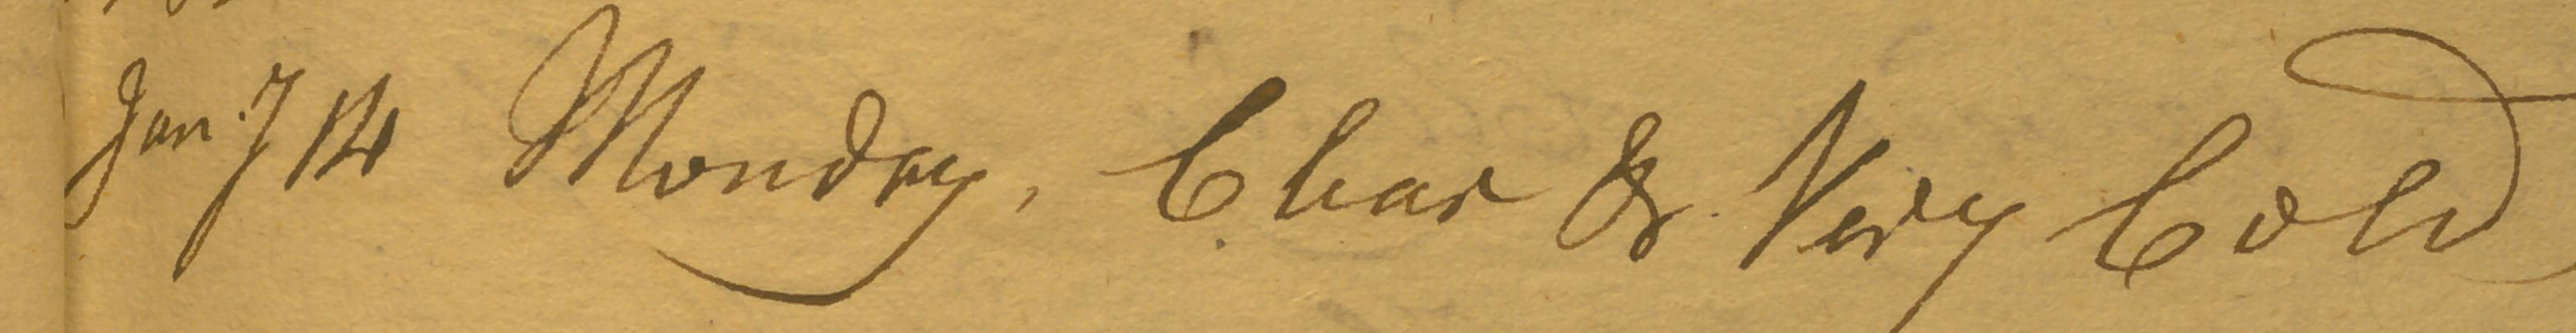Jan^y. 14 Monday. Clear & Very Cold
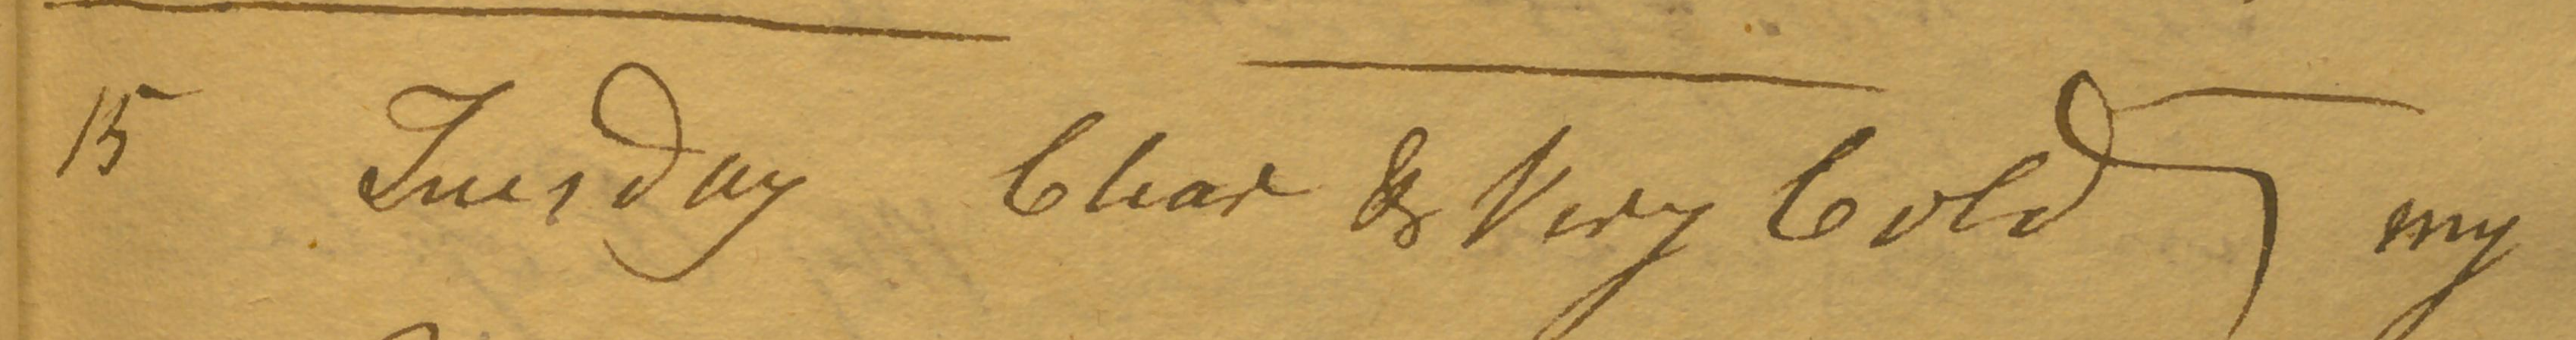15 Tuesday Clear & Very Cold my
